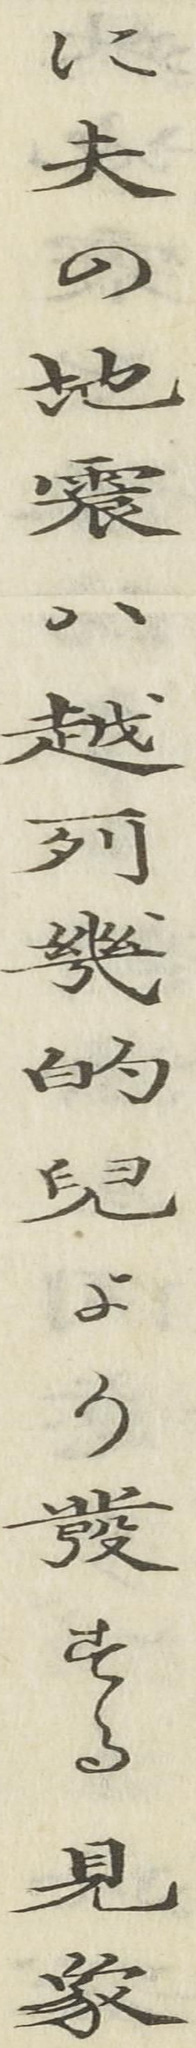に夫の地震は越列幾的児より発する見象
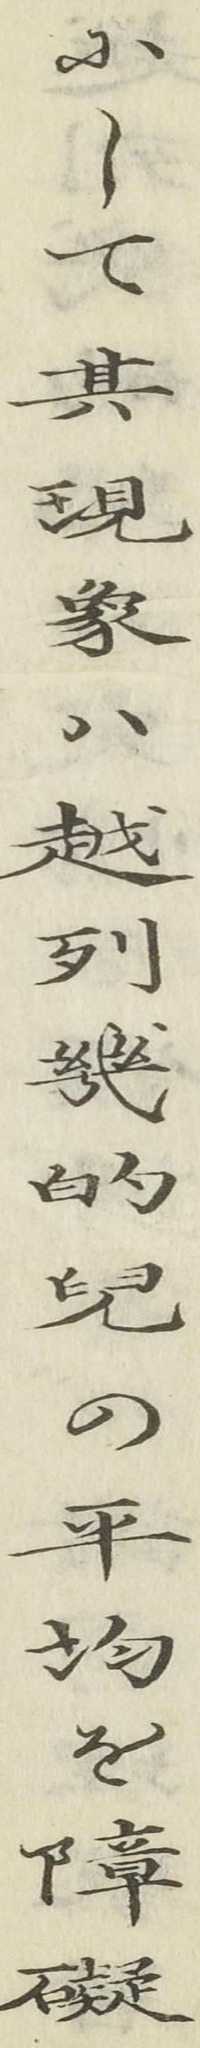にして其現象は越列幾的児の平均を障礙
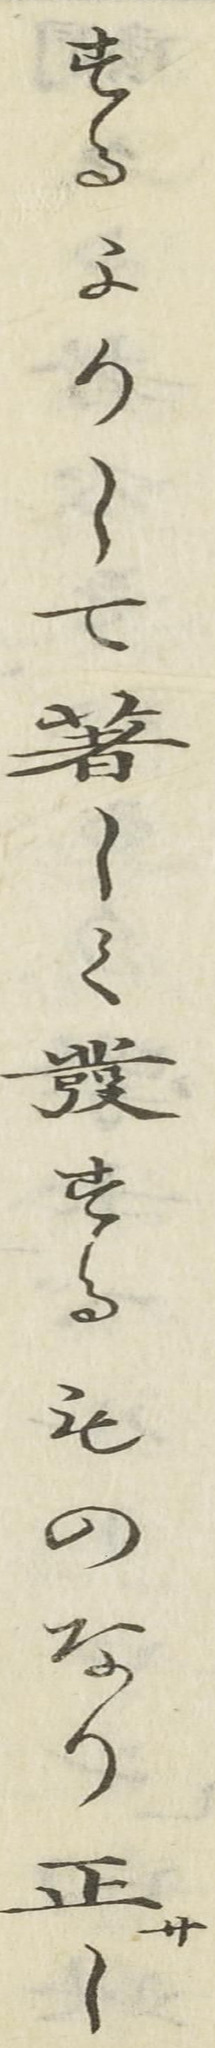するよりして著しく発するものなり正
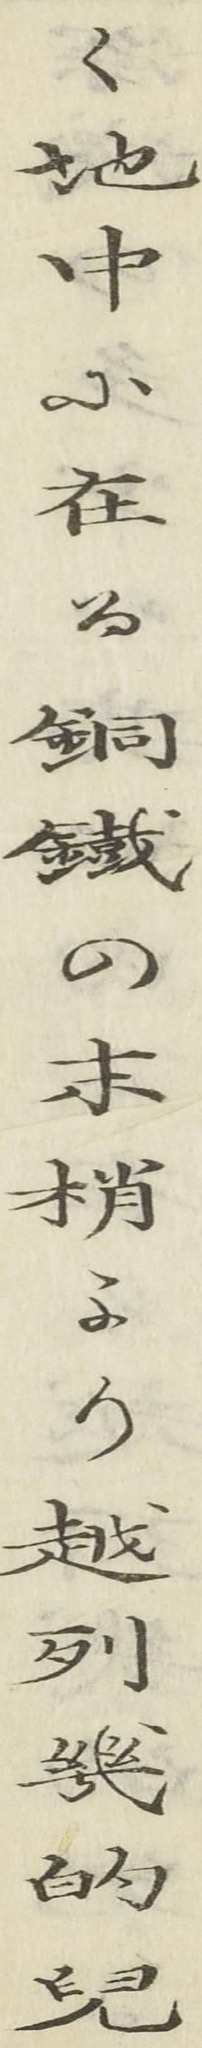く地中に在る銅鉄の末梢より越列幾的児
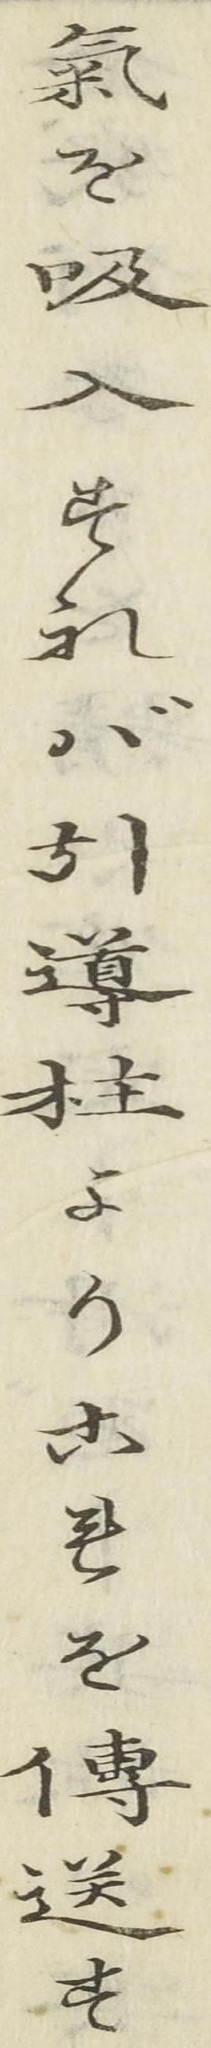気を吸入すれば引導柱よりこれを伝送す
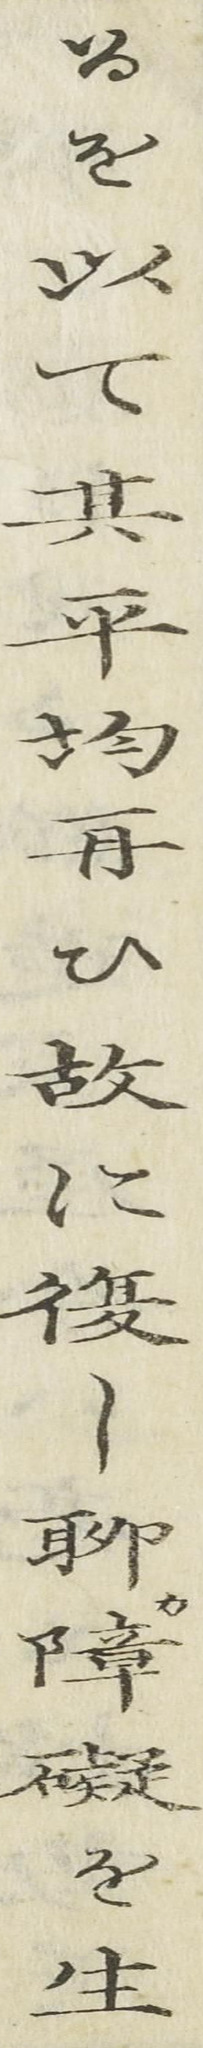るを以て其平均再び故に復し聊か障礙を生
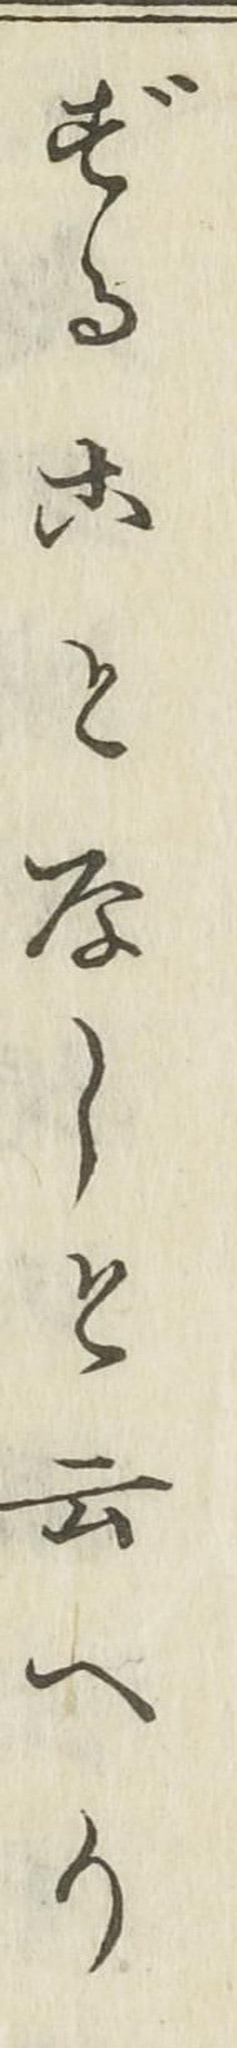ずることなしと云へり
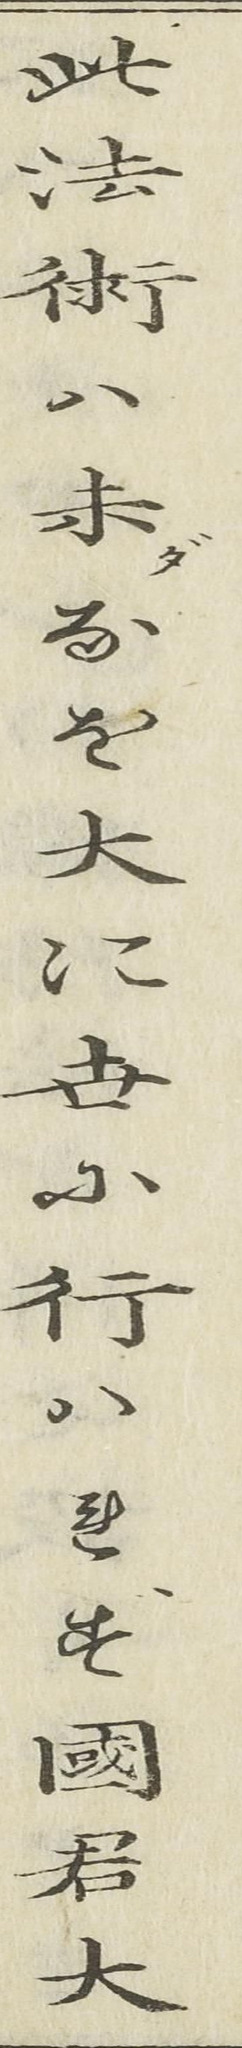此法術は未大に世に行はれす国君大
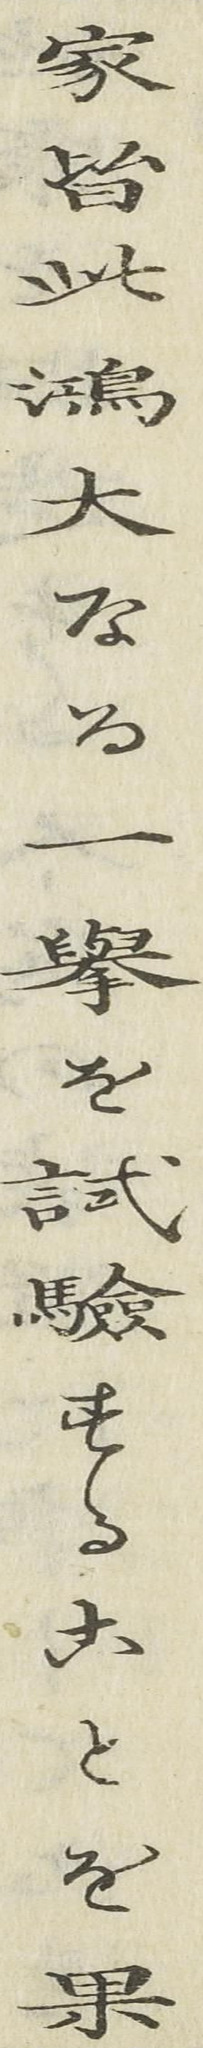家皆此鴻大なる一挙を試験することを果
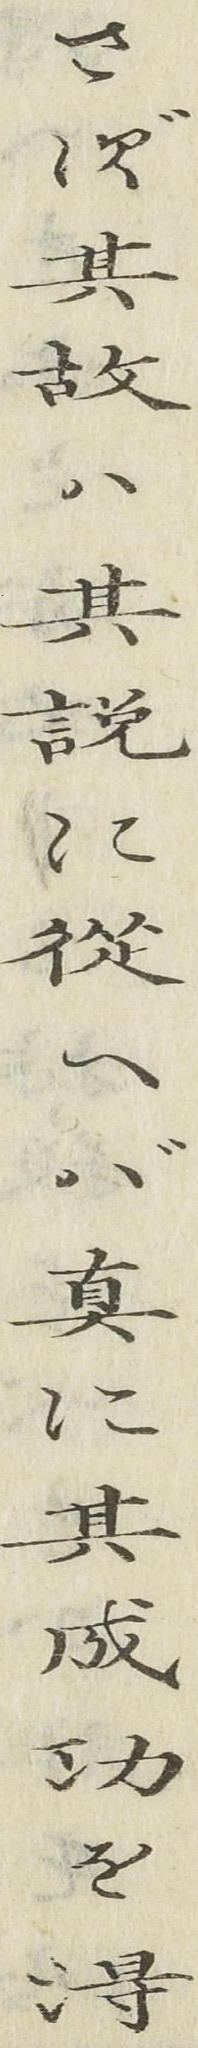さば其故は其説従へば真に其成功を得
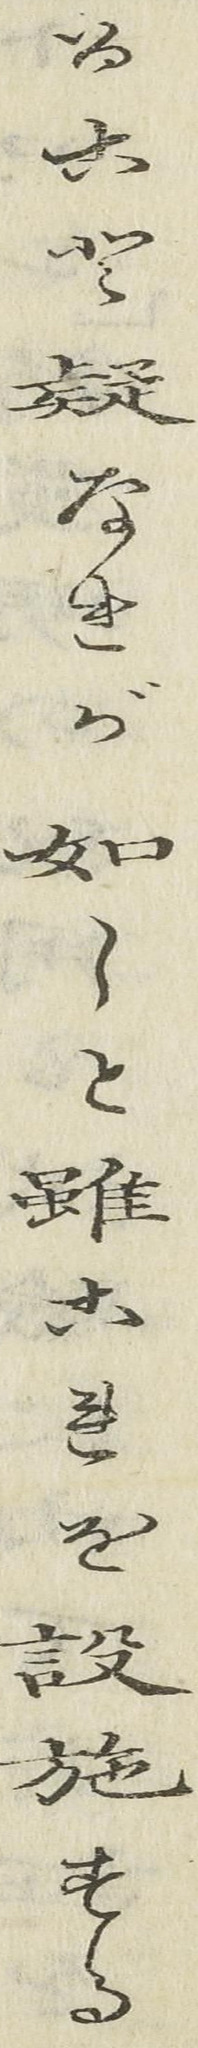ること疑なきが如しと雖これを設施する
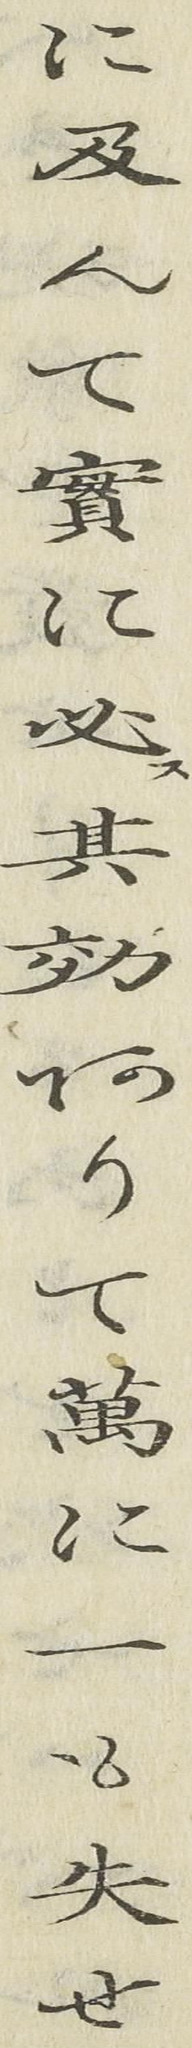に及んで実に必其効ありて萬に一も失せ
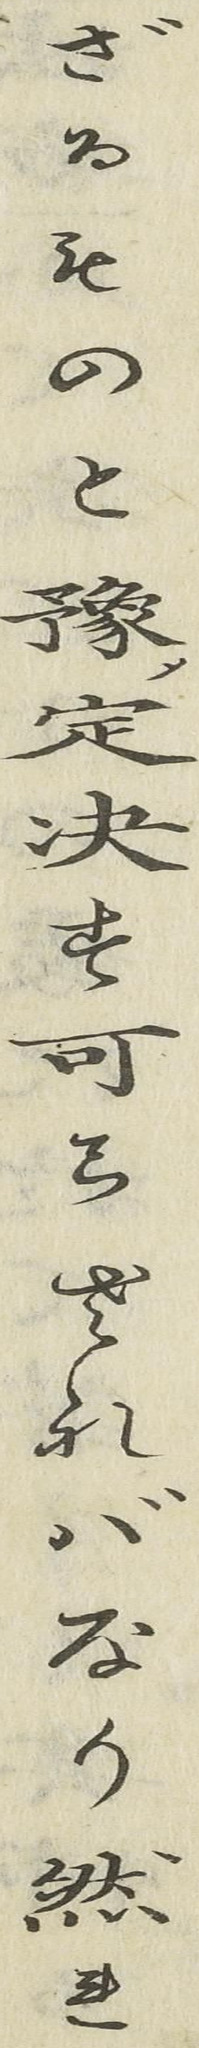ざるものと予定決す可らざればなり然れ
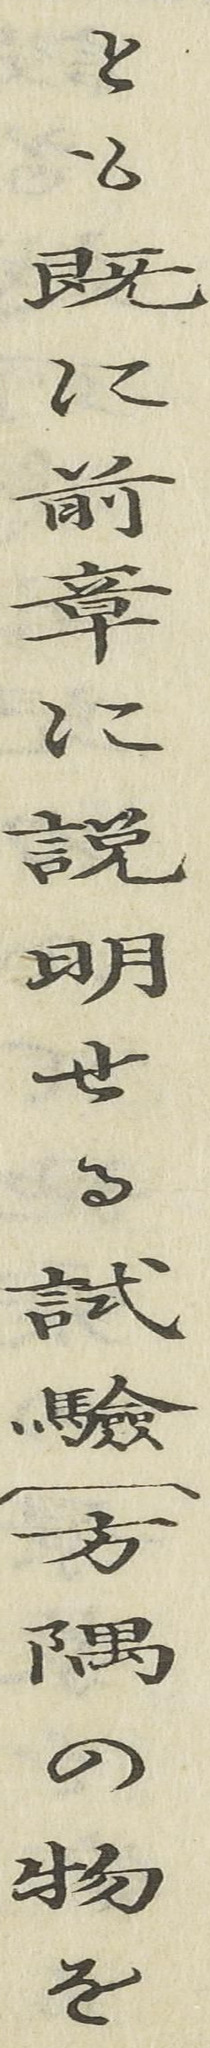とも既に前章に説明せる試験〔方隅の物を

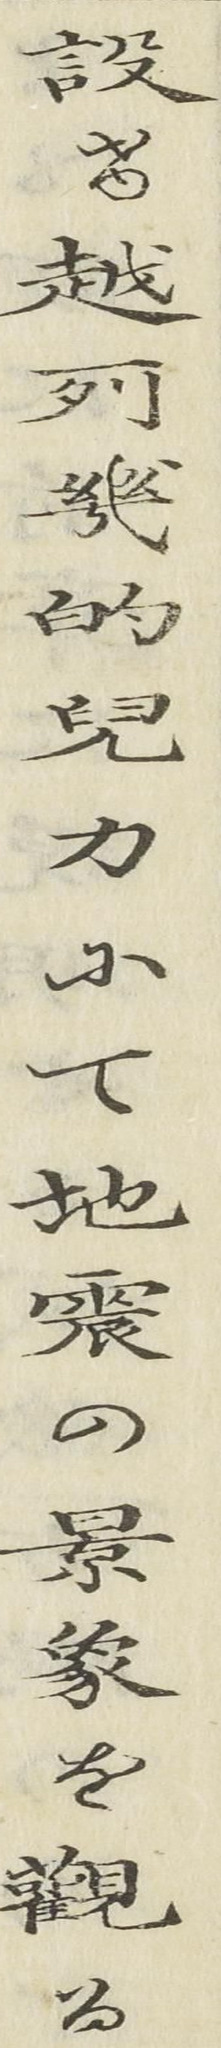設け越列幾的児力にて地震の景象を観る
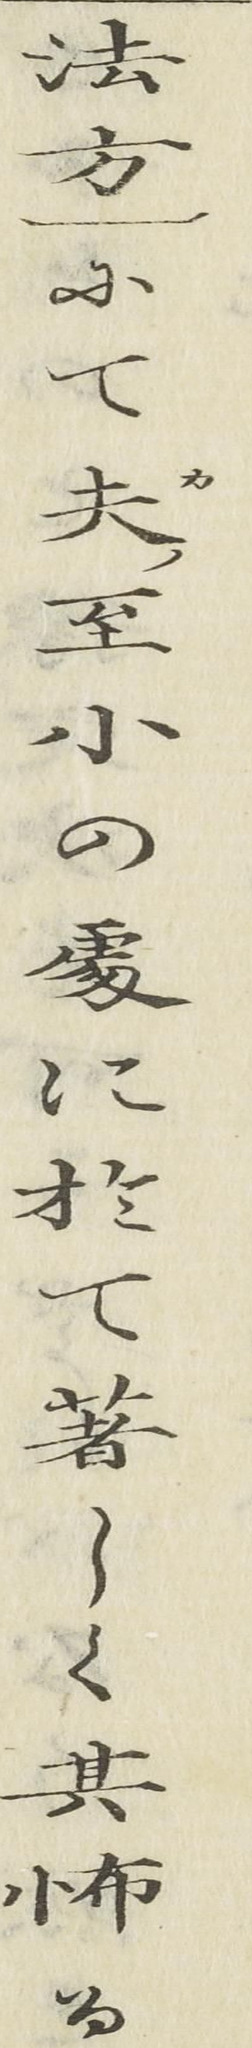法方にて夫至小の処に於て著しく其怖る
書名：地震預防説
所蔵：東京大学地震研究所図書室 Earthquake Research Institute Library, The University of Tokyo, JAPAN
